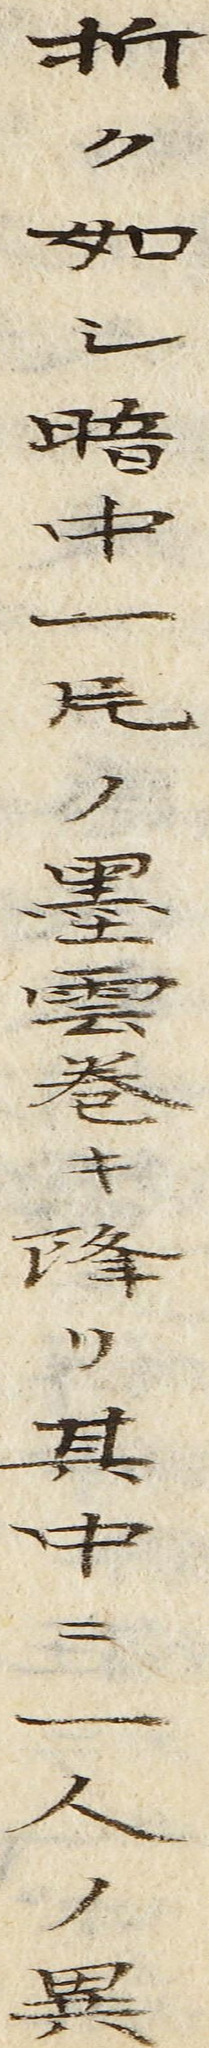折ク如シ暗中一片ノ墨雲巻キ降リ其中ニ一人ノ異
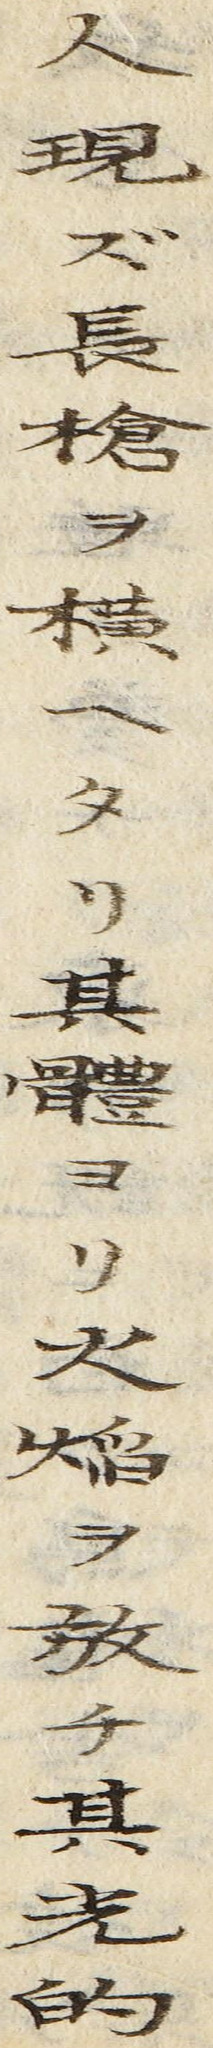人現ズ長槍ヲ横ヘタリ其体ヨリ火焔ヲ放チ其光的
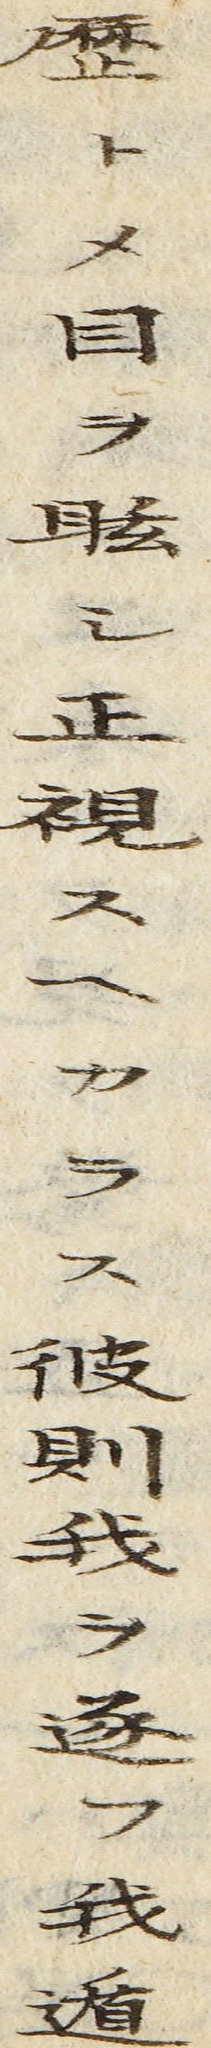歴トシテ目ヲ眩シ正視スヘカラス彼則我ヲ逐フ我遁
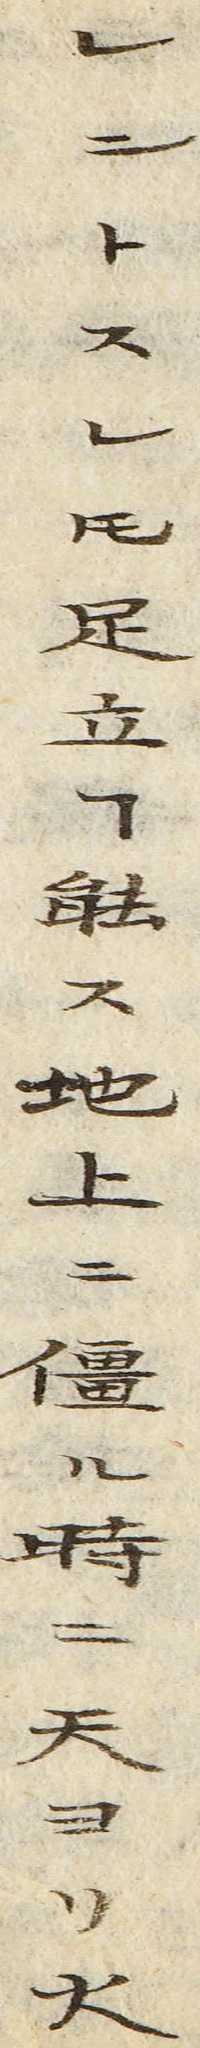レントスレトモ足立コト能ス地上ニ僵ル時ニ天ヨリ火
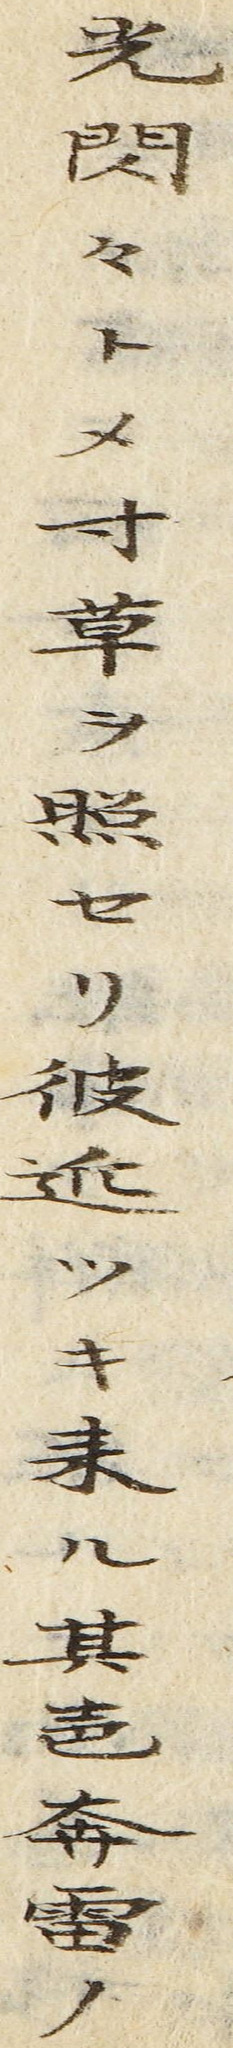光閃々トシテ寸草ヲ照セリ彼近ツキ来ル其声奔雷ノ

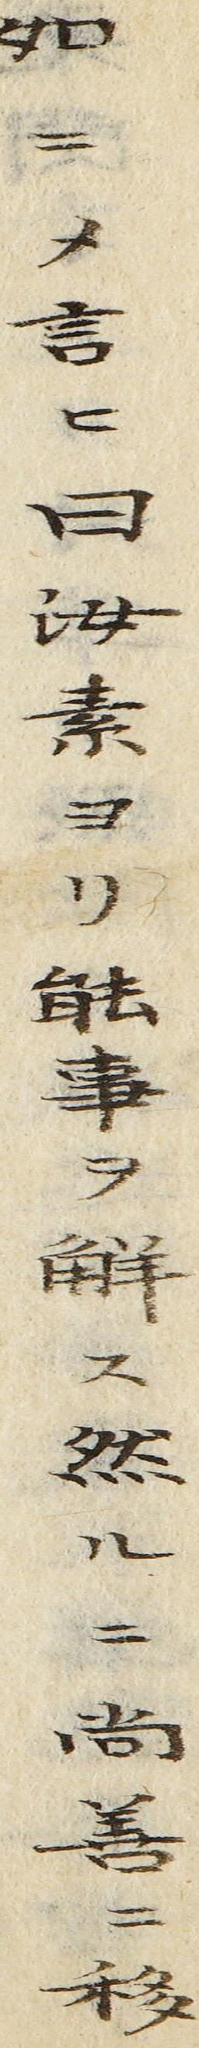如ニシテ言ヒ曰汝素ヨリ能事ヲ解ス然ルニ尚善ニ移
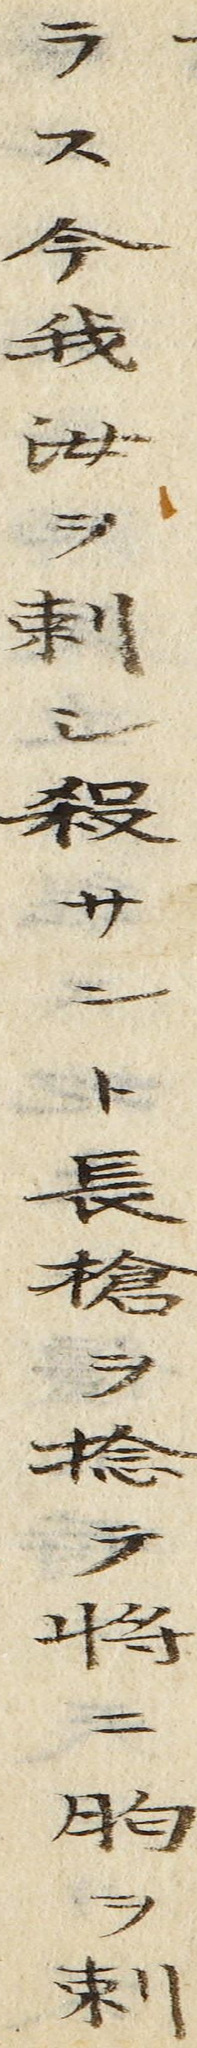ラス今我汝ヲ刺シ殺サント長槍ヲ捻テ将ニ胸ヲ刺
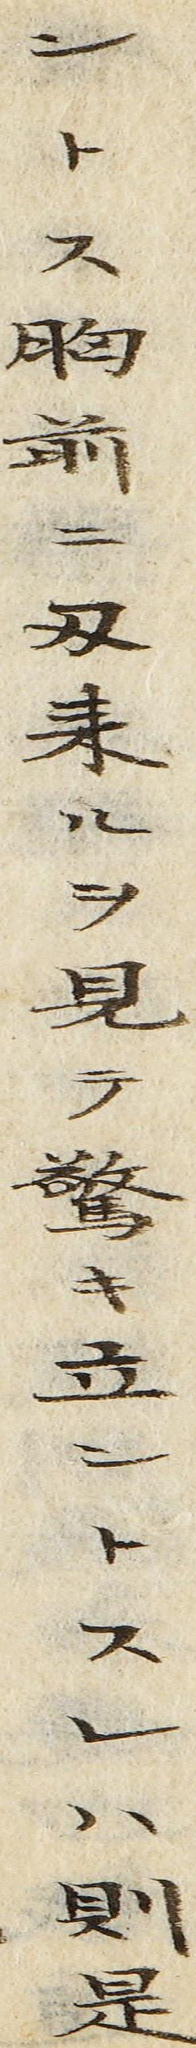ントス胸前ニ刃来ルヲ見テ驚キ立ントスレハ則是
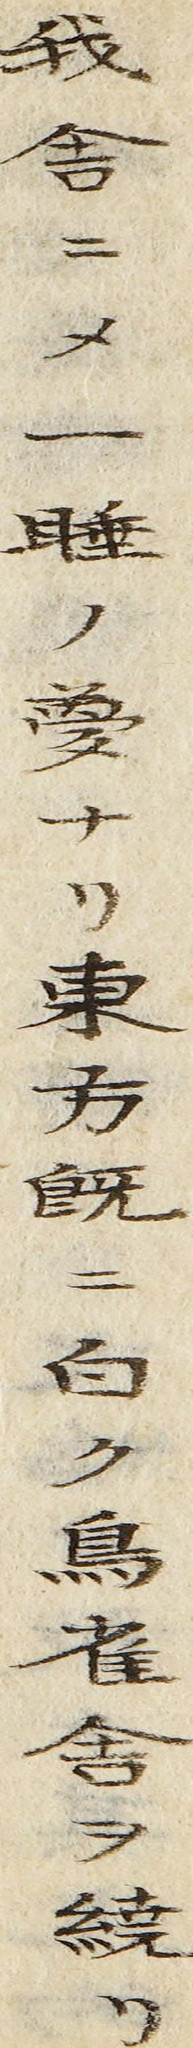我舎ニシテ一睡ノ夢ナリ東方既ニ白ク鳥雀舎ヲ繞リ
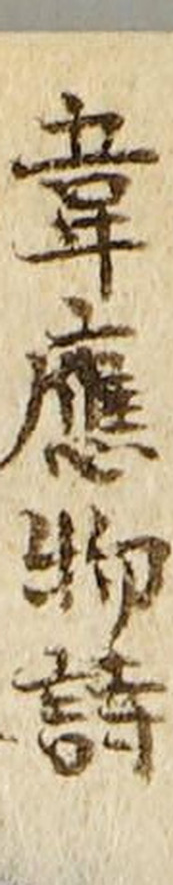韋応物詩
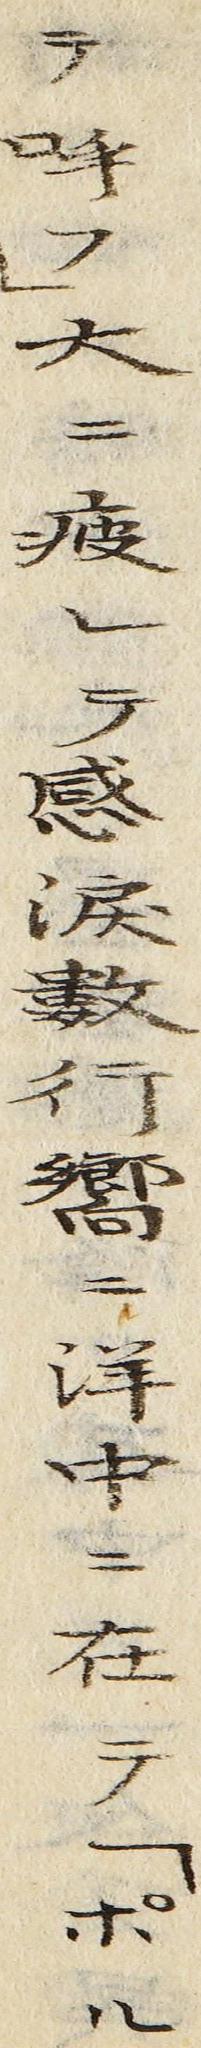テ呼フ」大ニ疲レテ感涙数行嚮ニ洋中ニ在テ「ポル
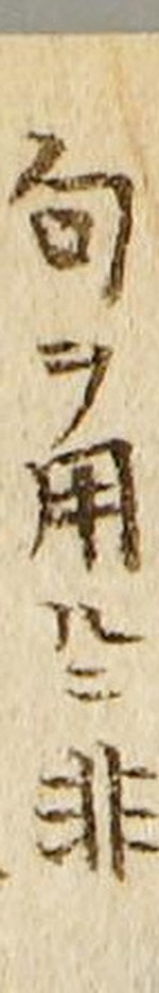句ヲ用ルニ非
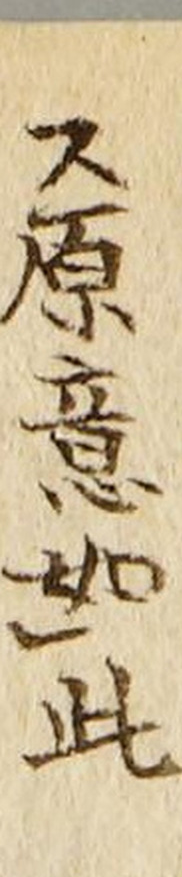ス原意如此
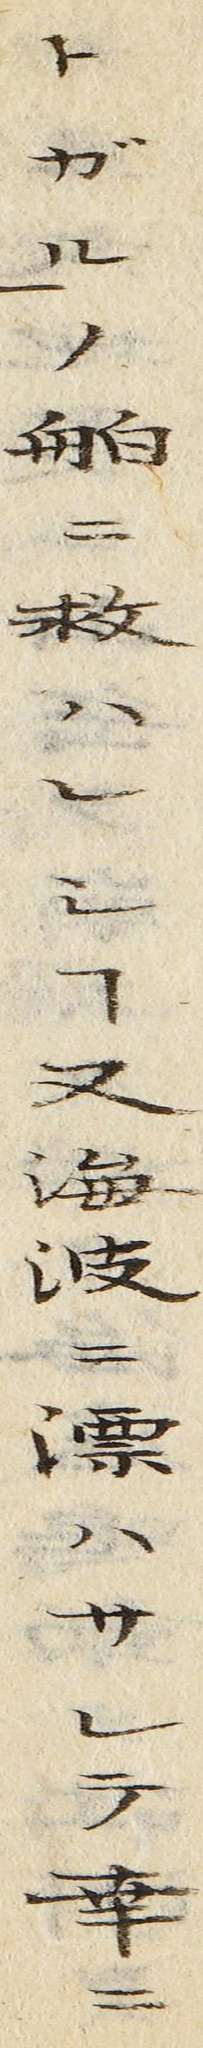トガル」ノ舶ニ救ハレシコト又海波ニ漂ハサレテ幸ニ
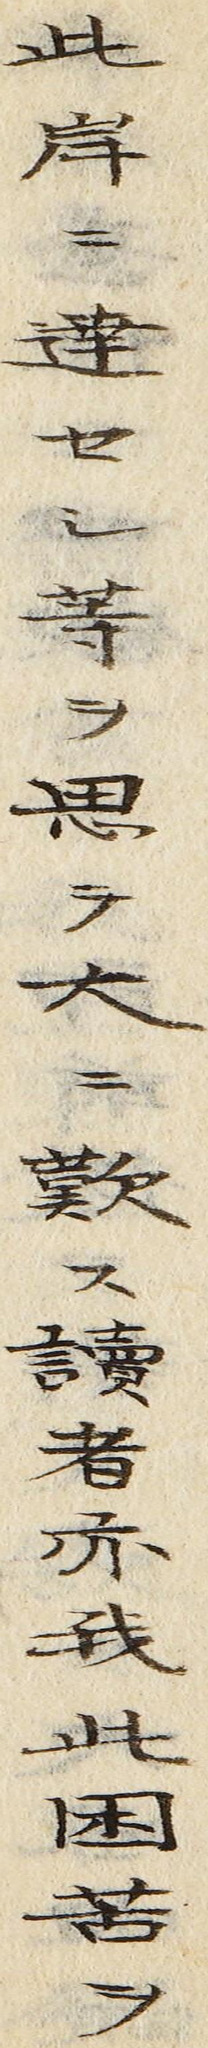此岸ニ達セシ等ヲ思テ大ニ歎ス読者亦我此困苦ヲ
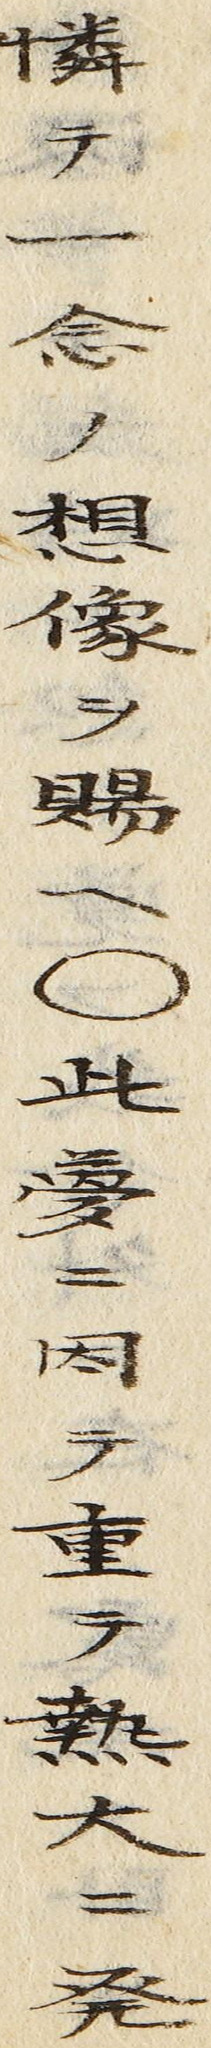憐テ一念ノ想像ヲ賜ヘ◯此夢ニ因テ重テ熱大ニ発
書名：漂流紀事
